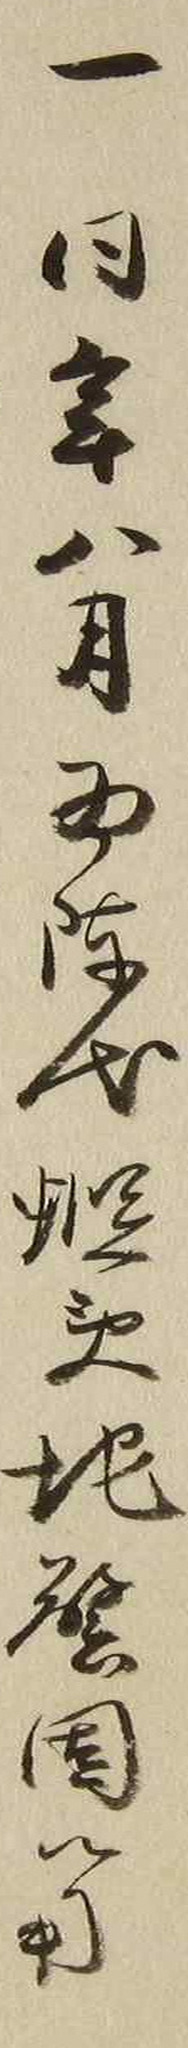一同年八月為陣代蝦夷地警固御用
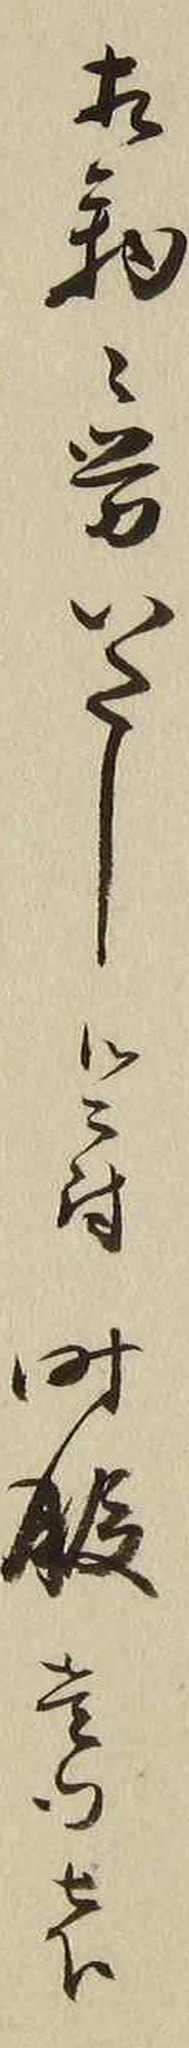相勤々労いたし候ニ付時服壱ツ被下
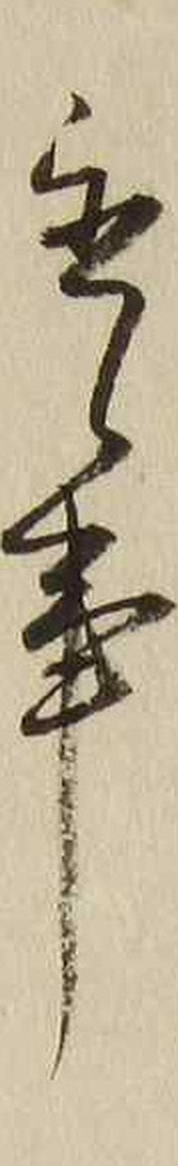置候事
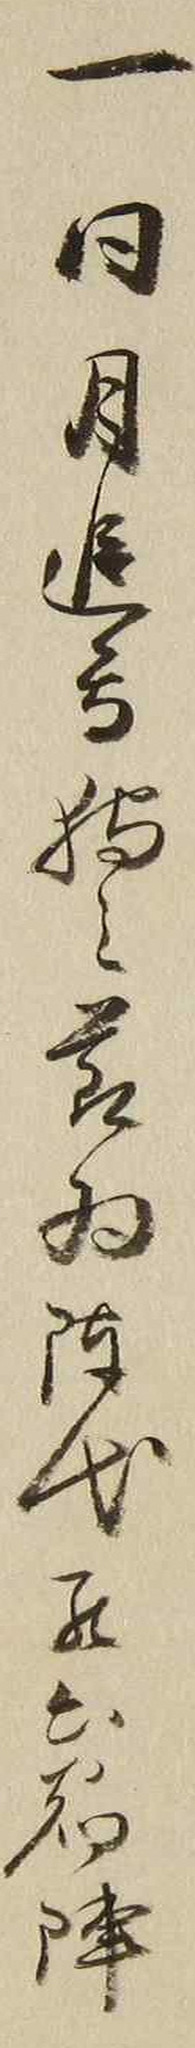一同月追鳥狩之節為陣代罷出宿陣
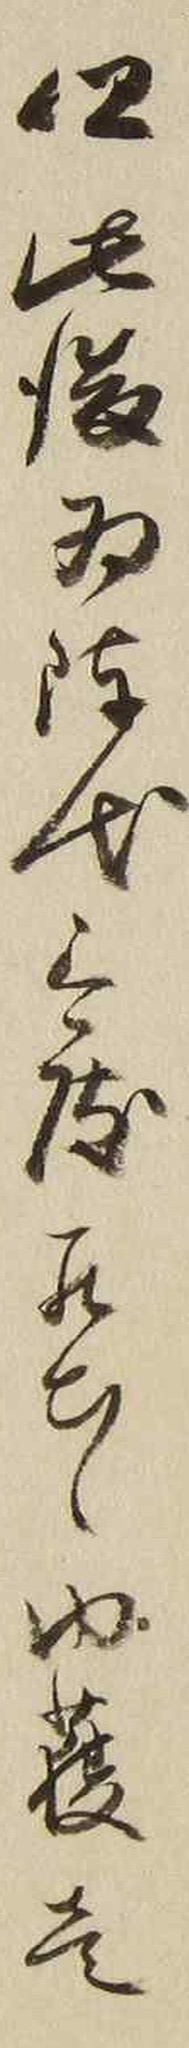但此後為陣代三度罷出候内獲壱
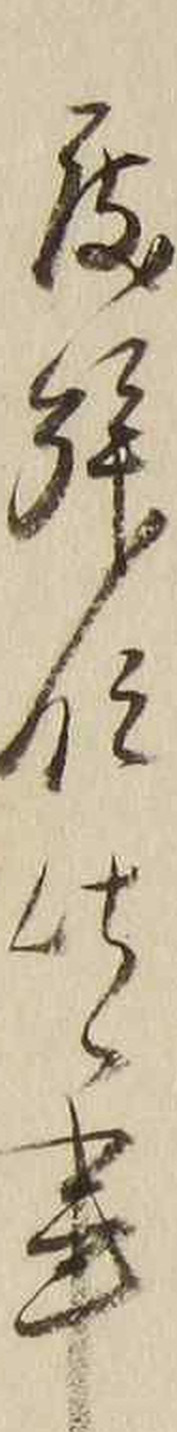度拝領仕候事
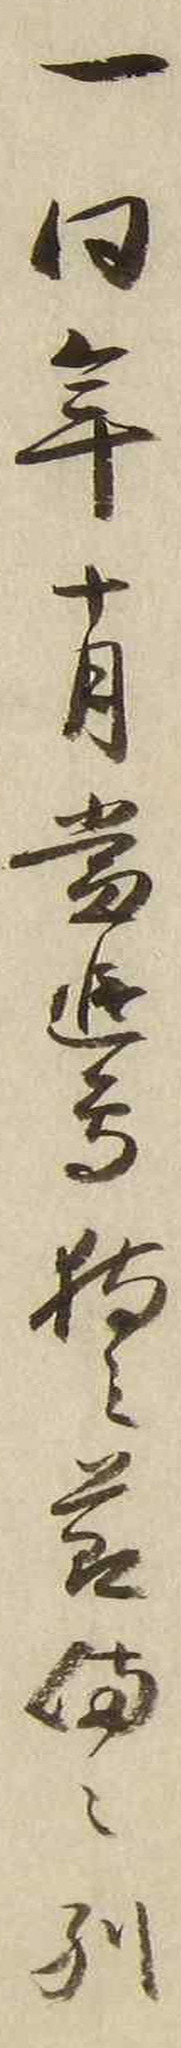一同年十月当追鳥狩之節備之列

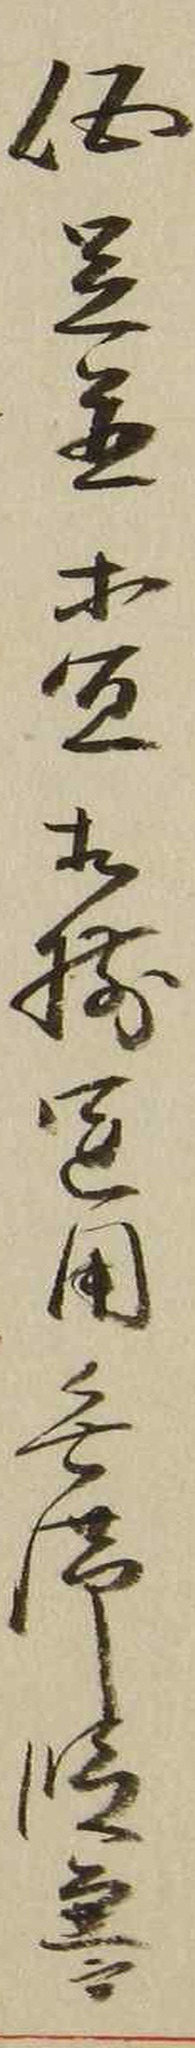伍足並等宜相揃運用無滞段兼而
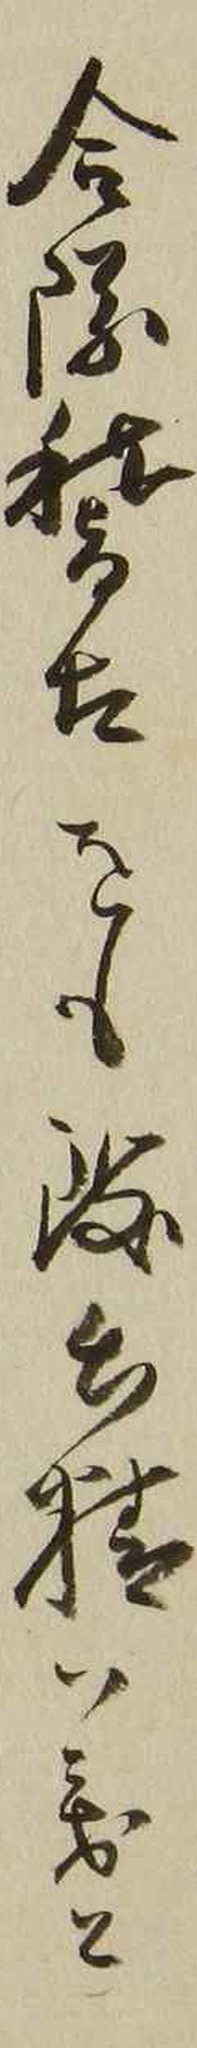合隊稽古をも致出精候義と
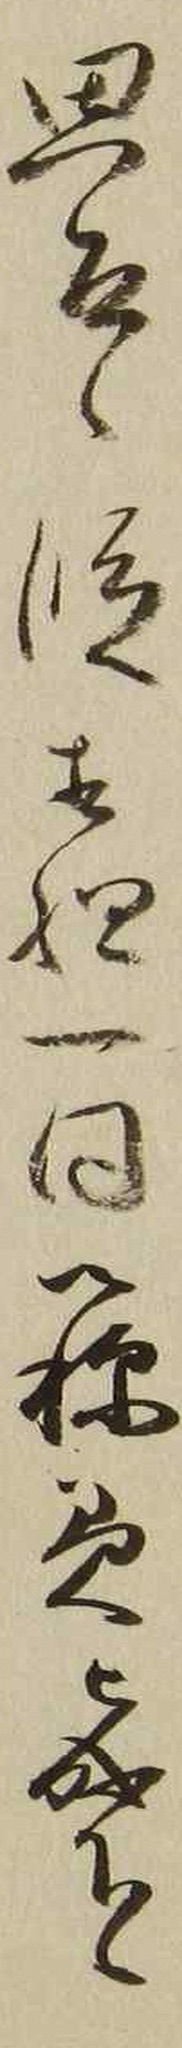思召候段相組一同御称美被成下候
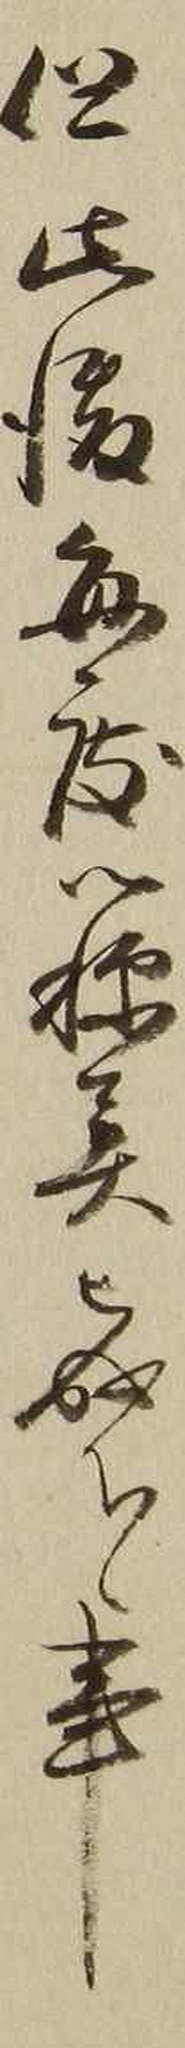但此後毎度御称美被成下候事
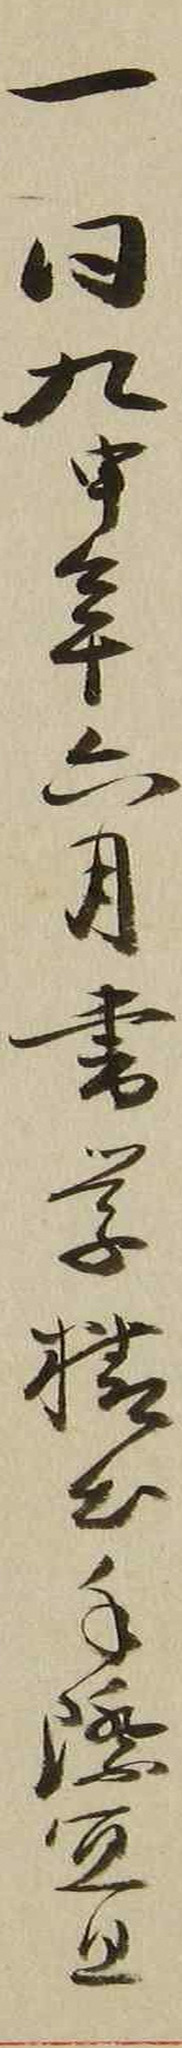一同九申年六月書学精出手際宜且
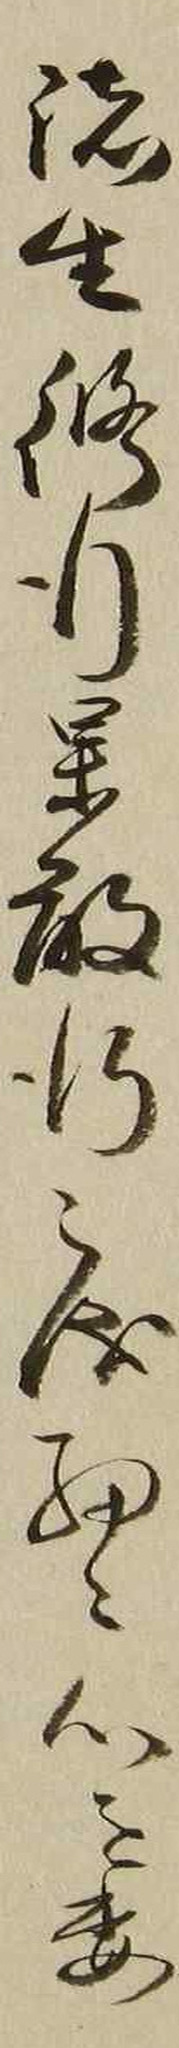諸生修行果敢行之儀細々心を委
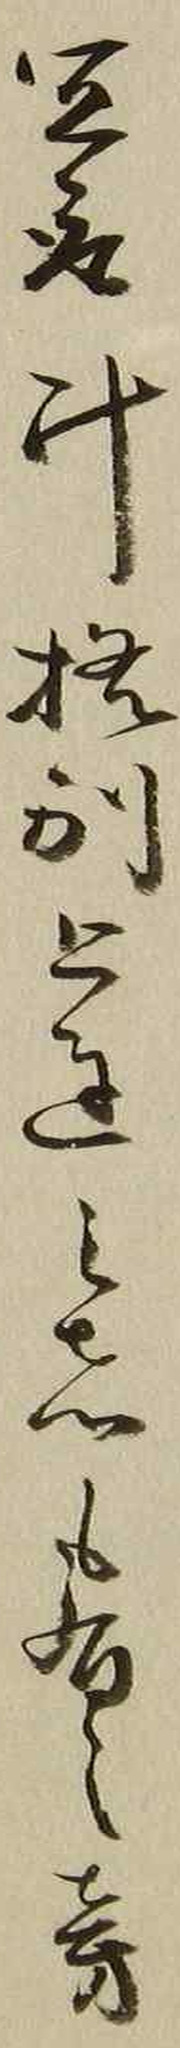宜取計格別上達之者も有之傍
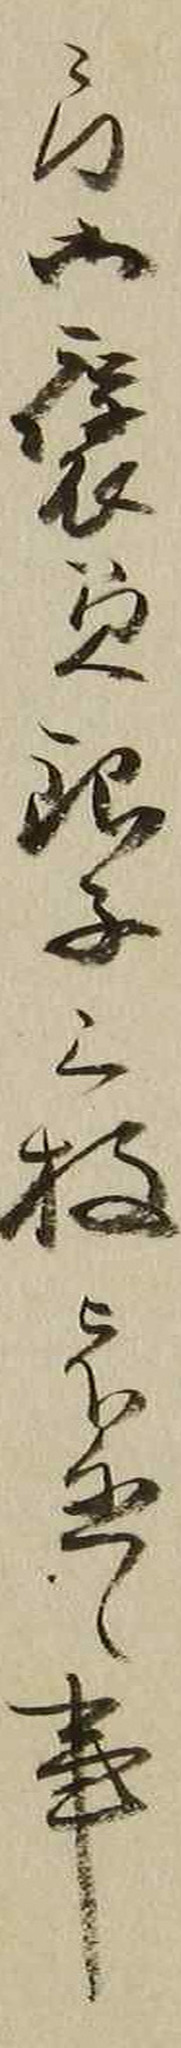ニ付御褒美銀子三枚被下置候事
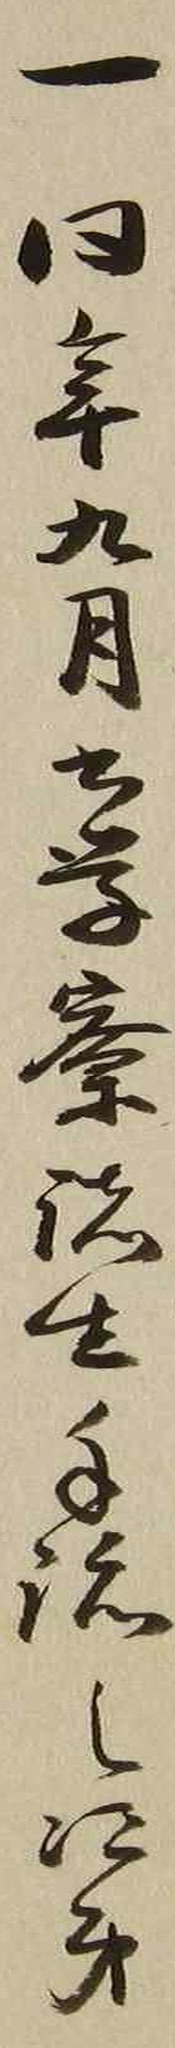一同年九月書学寮諸生手諸之次第
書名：諸士系譜　巻之288　さ之部20
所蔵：会津若松市立会津図書館
